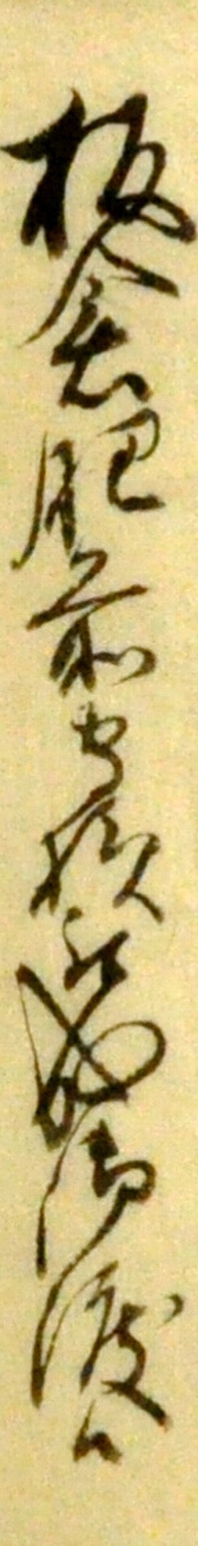板倉肥前守様被成御渡候
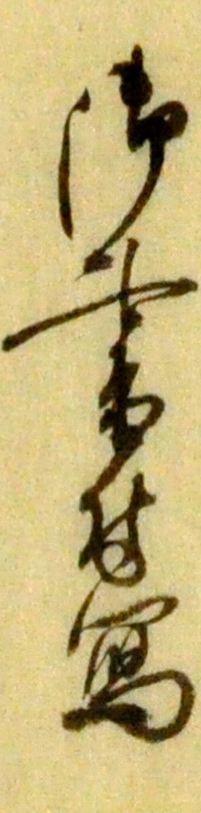御書付写

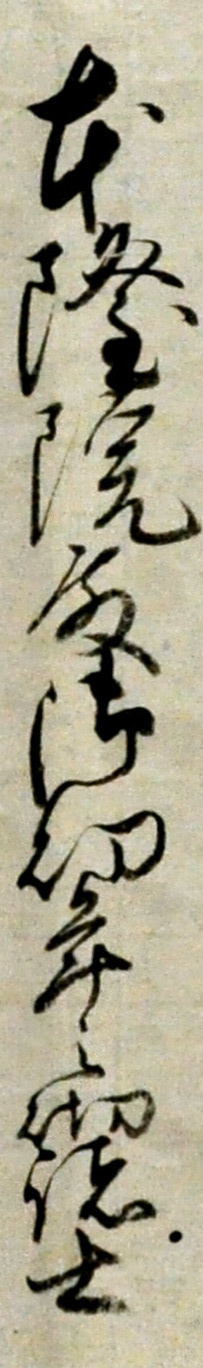本隆院殿御幼年之砌諸士
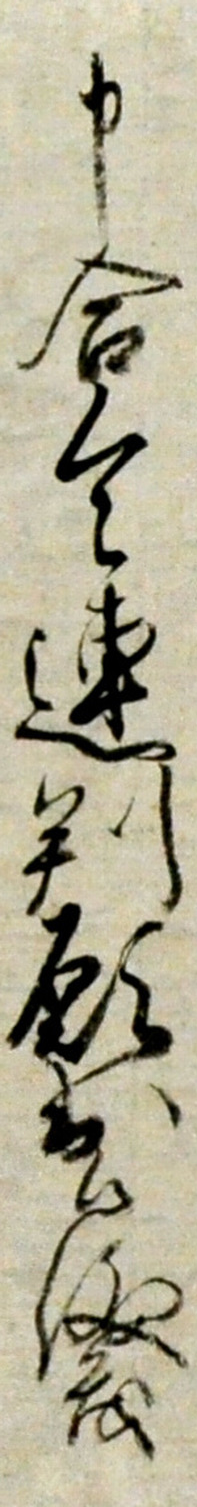申合令連判願出候儀茂
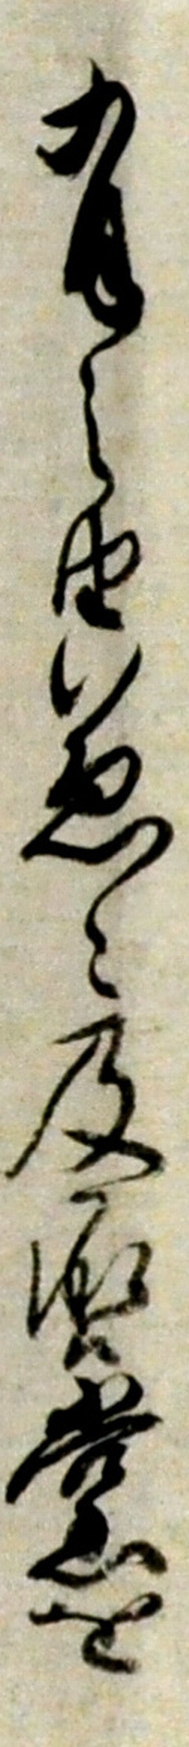有之由兼々及承候党を
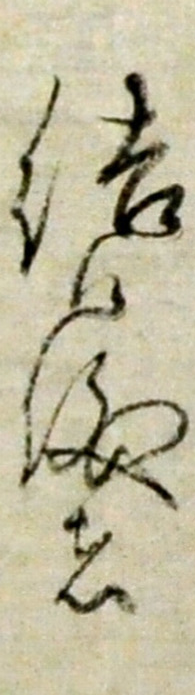結候儀者
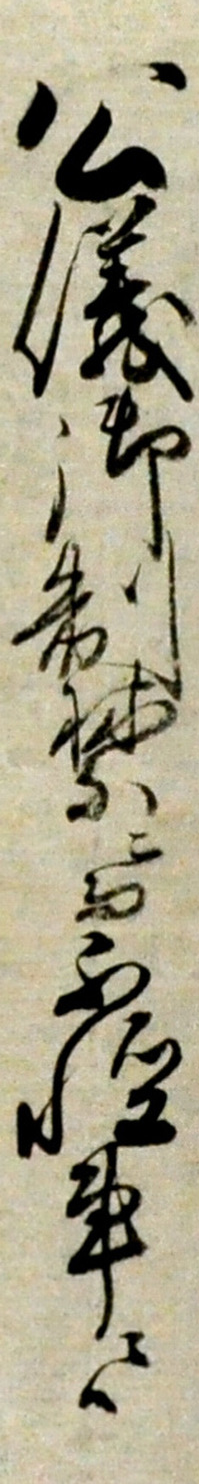公儀御制禁ニ而不軽事ニ候
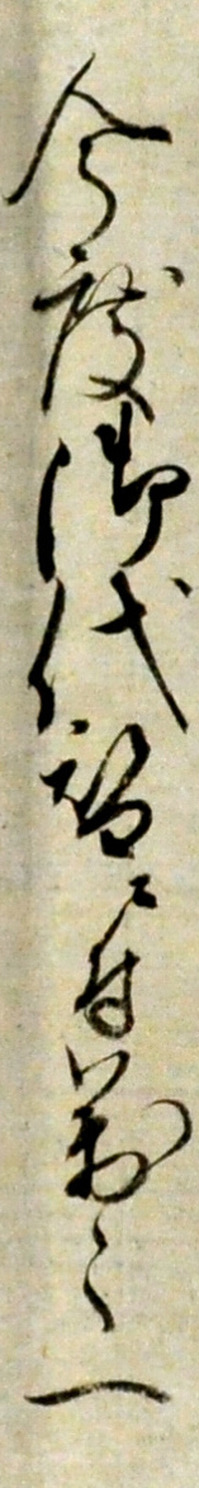今度御代替ニ付万々一
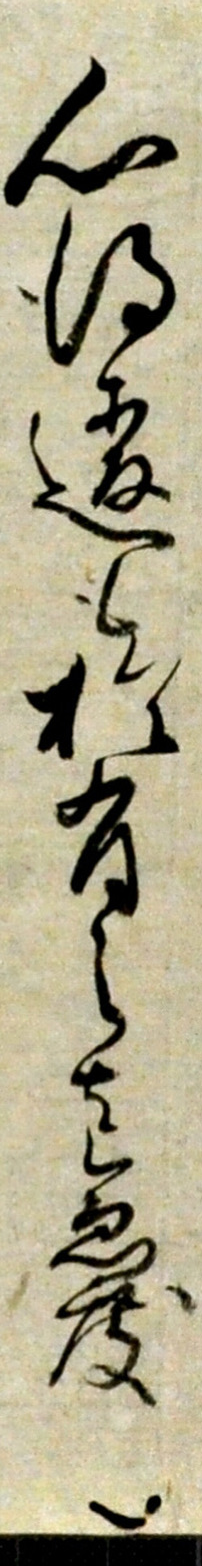心得違も於有之者急度
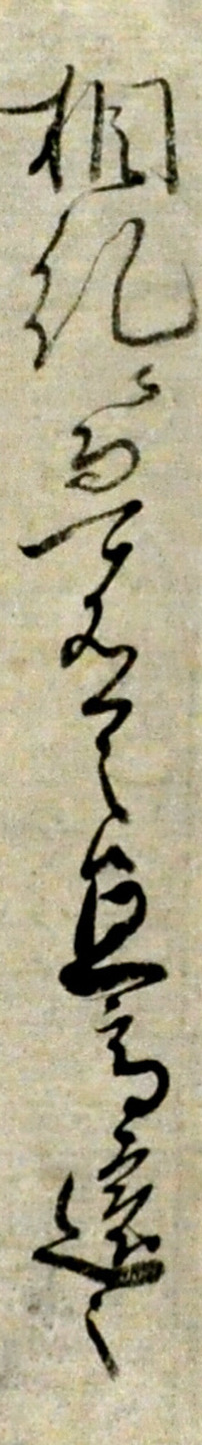相糺ニ而可有之候且高遠之
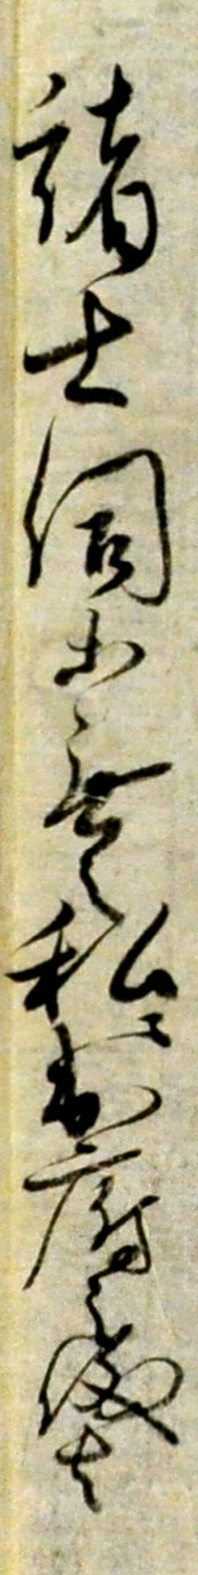諸士伺等無之私ニ出府之儀者
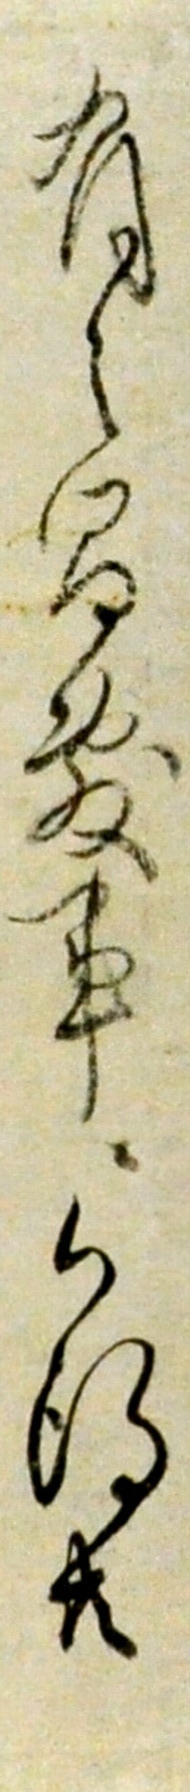有之間敷事に候得共
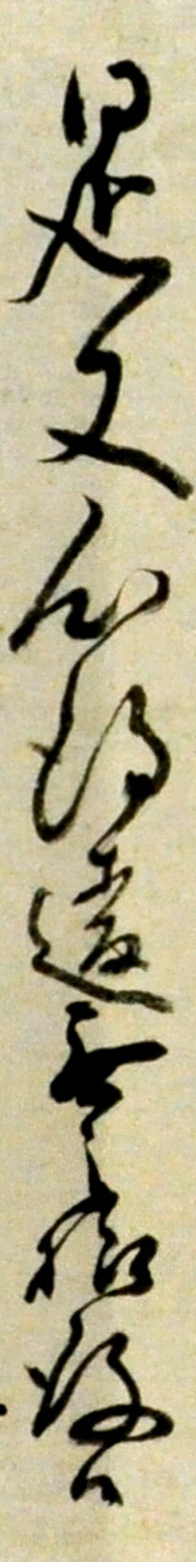是又心得違無之様存候
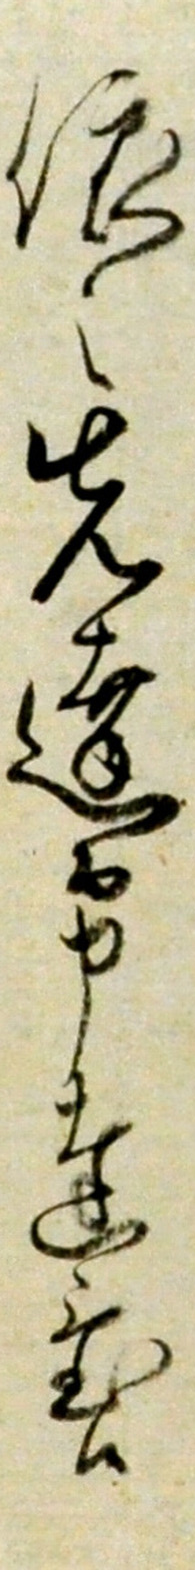依之先達而申達置候
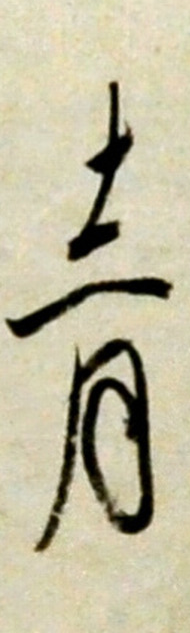十二月
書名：御書付写
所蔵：伊那市立高遠町図書館・合同会社AMANE
